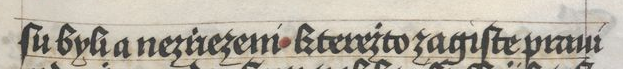ſu byli a nezṙiezeni.ktereżto zagiſte praví
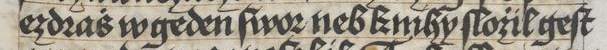ezdraṡ w geden ſwor neb knihy ſlożil gest
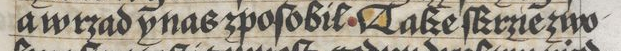a wrzad ynas zpoſobil.Take ſkrzie zwo¬
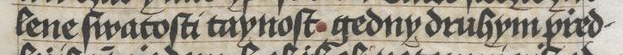lene ſwatoſti taynoſt.gedny druhym pṙed¬
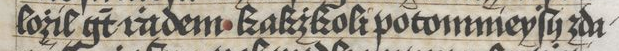ložil ḡt ṙadem.kakżkoli potomnieyẛij zda¬
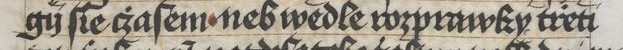gij ſie czaſem.neb wedle rozprawky tṙeti
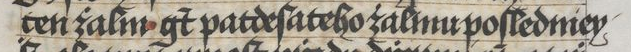ten żalm.ḡt patdeſateho żalmu poſledniey¬
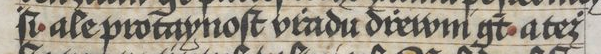ẛi. ale protaynoſt vṙadu dṙewní ḡt.a też
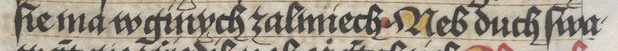ſie ma w ginych zalmiech.Neb duch ſwa¬
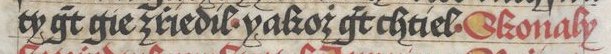ty ḡt gie zṙiedil.yakoż ḡt chtiel.Skonaly
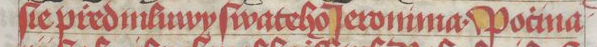ſie pṙedmluwy ſwateho Ieronima.Poċina¬
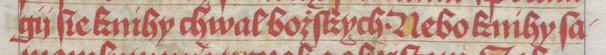gij ſie knihy chwal bożſkych.Nebo knihy ſa¬
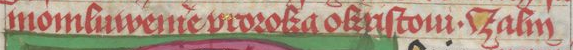momluwenie proroka okriſtovi.Zalm
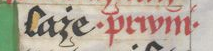laże.první.
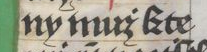ny muż kte¬
